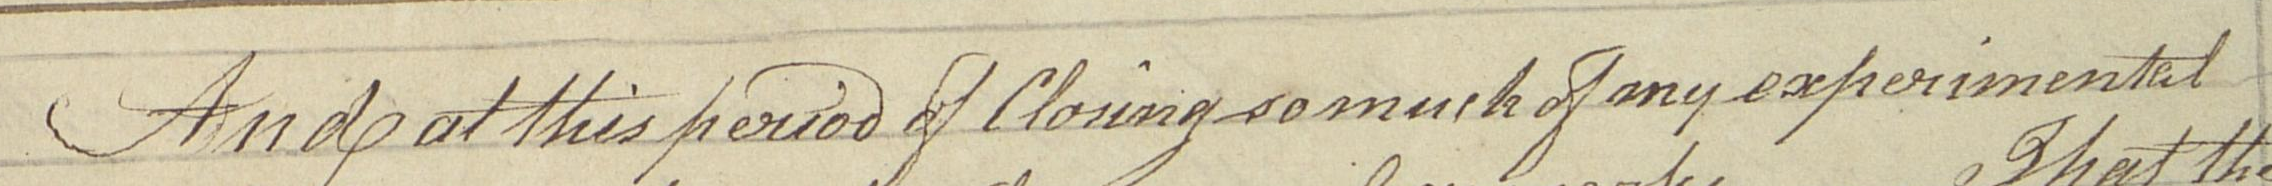And at this period of Closing so much of any experimental
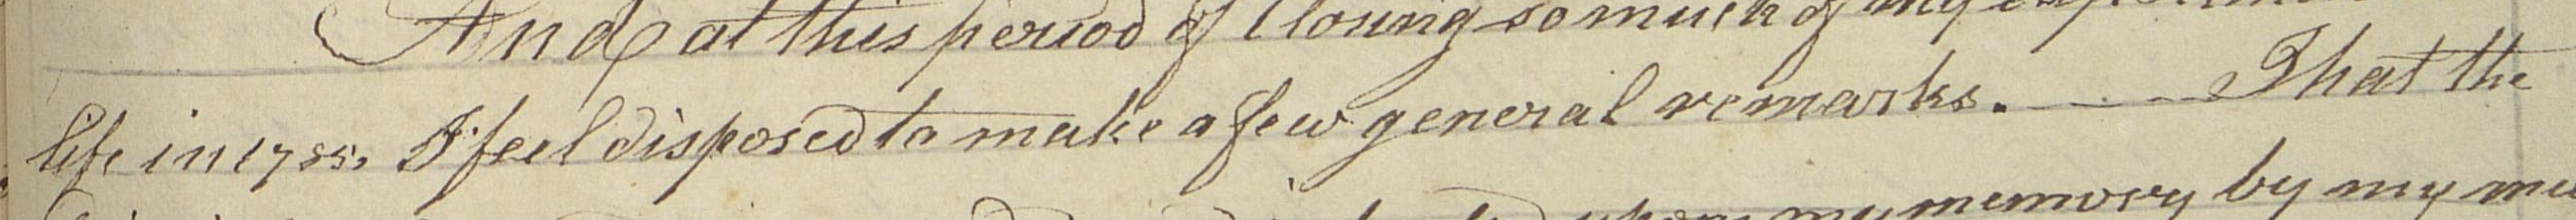life in 1783, I feel disposed to make a few general remarks. That the
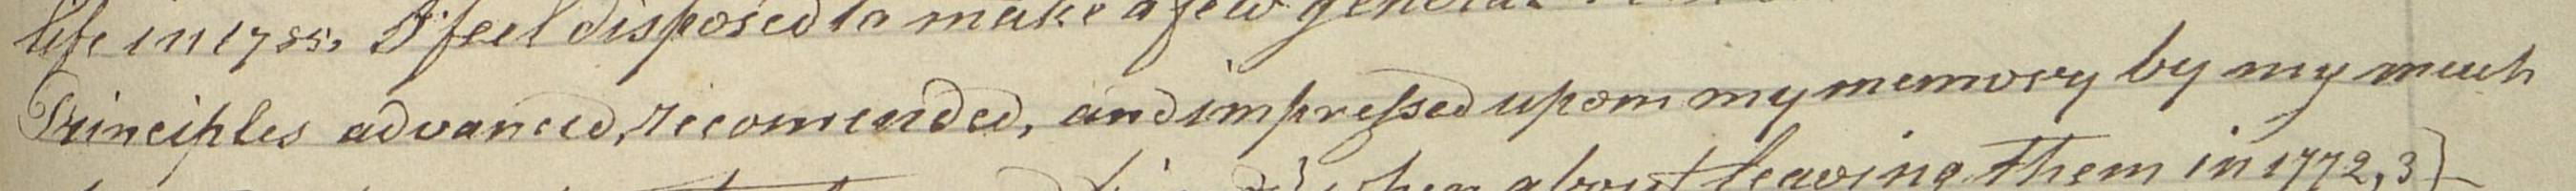Principles advanced recomended, and impressed upon my memory by my much
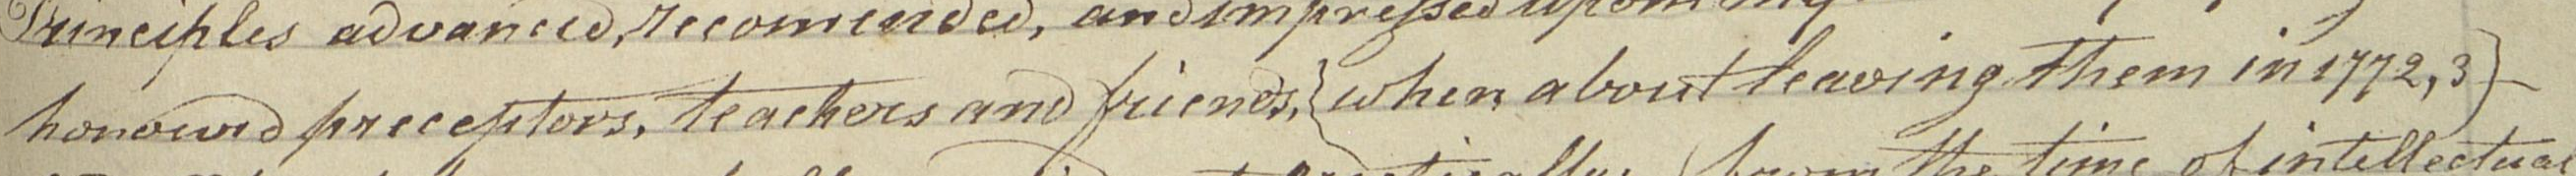honourd preceptors, teachers and friends, (when about leaving them in 1772,3)
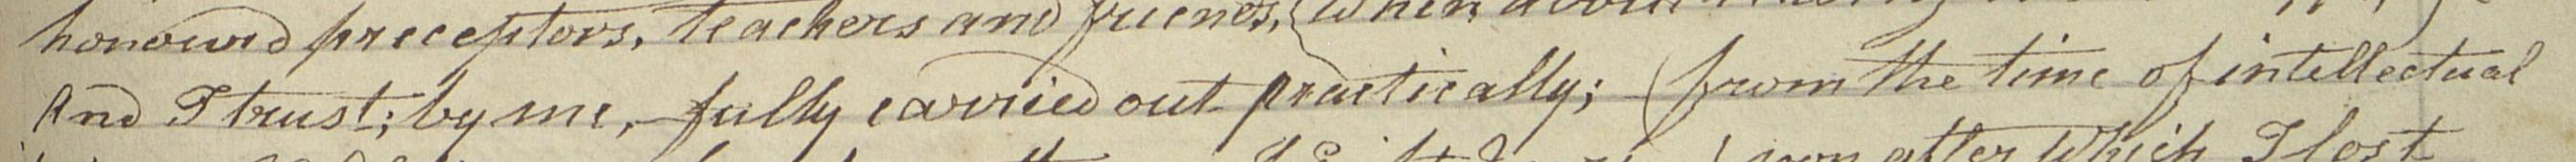And I bust; by me, fully carried out practically; (from the time of intellectual
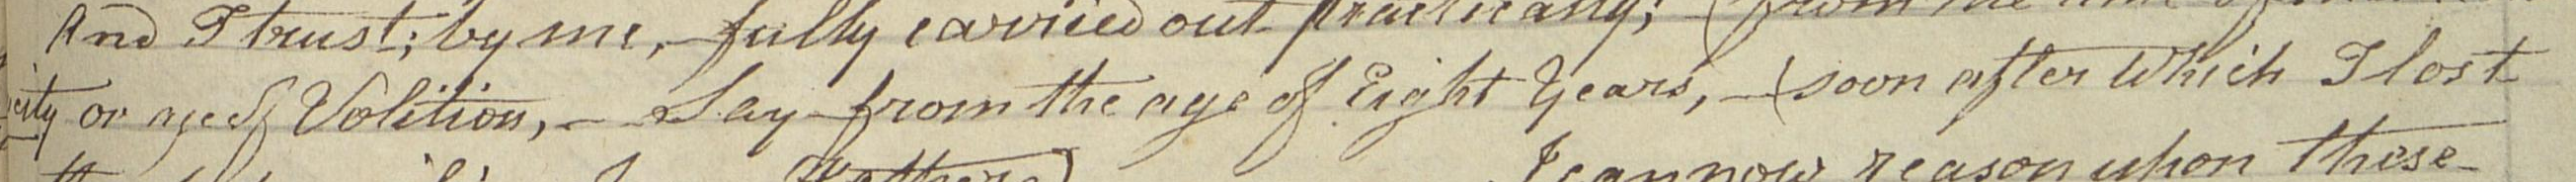-ity or age of Volition, Say from the age of Eight years, (soon after which I lost
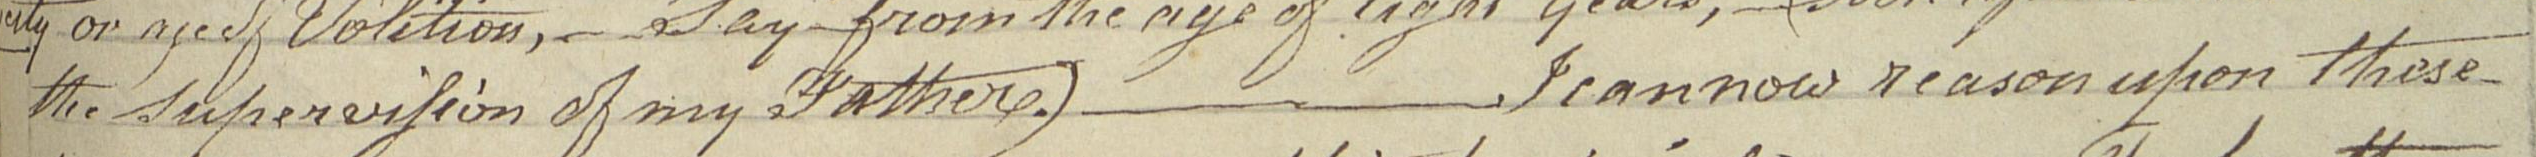the supervision of my Father.) I can now reason upon these
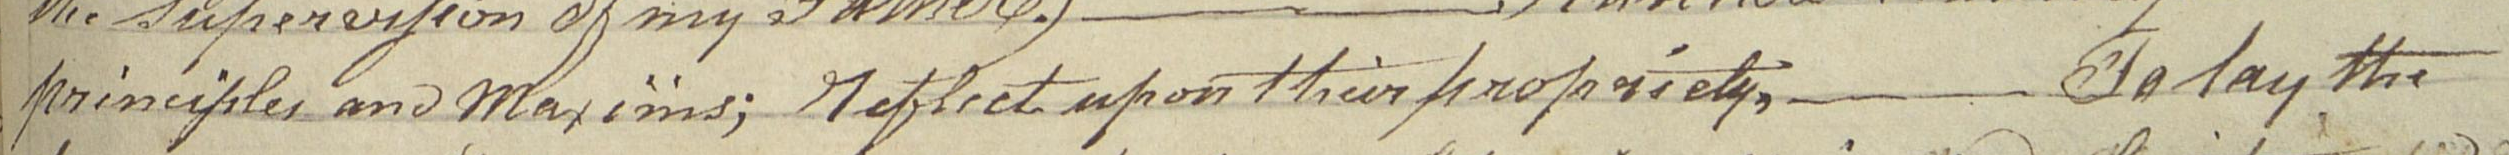principles and Maxims; Reflect upon their propriety, To lay the
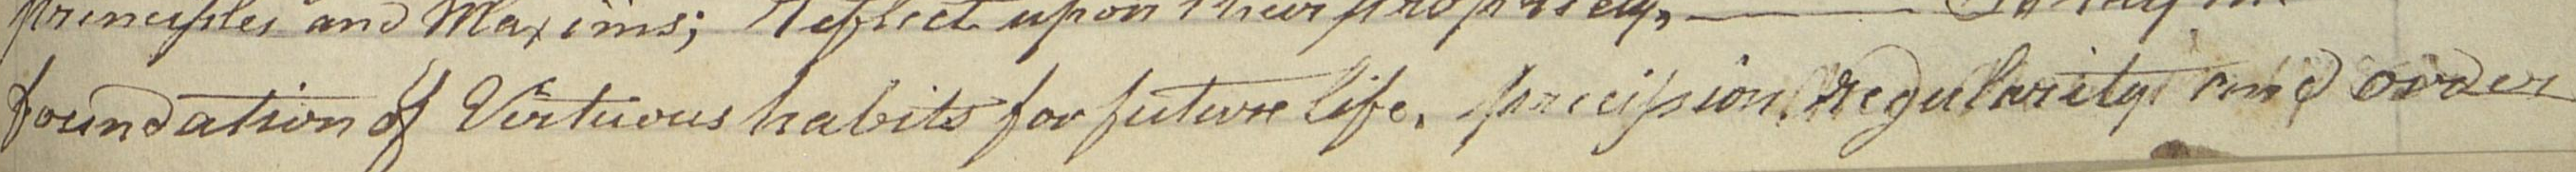foundation of Virtuous habits for future life, precision, regularity and order
